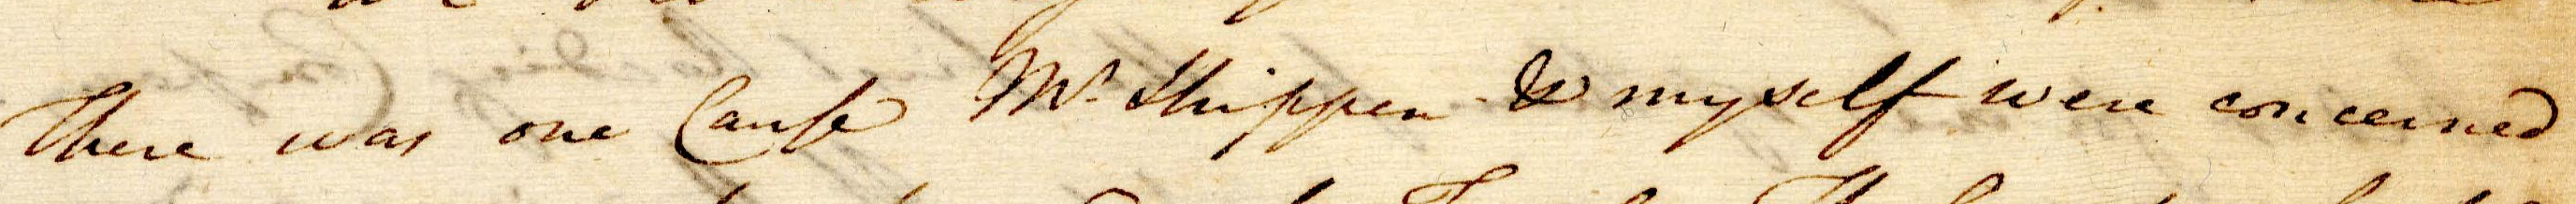There was one Cause M^r. Shippen & myself were concerned
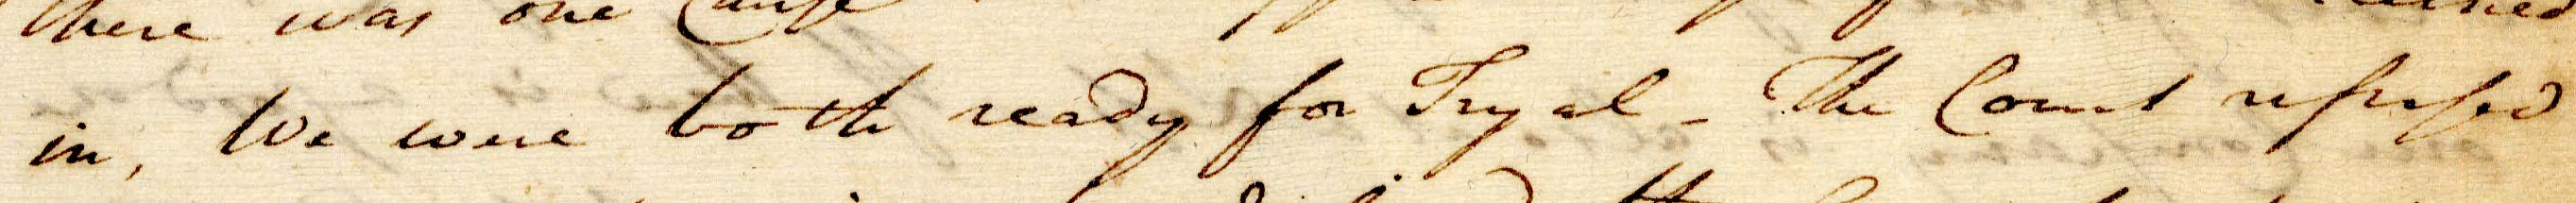in, We were both ready for Tryal. The Court refused
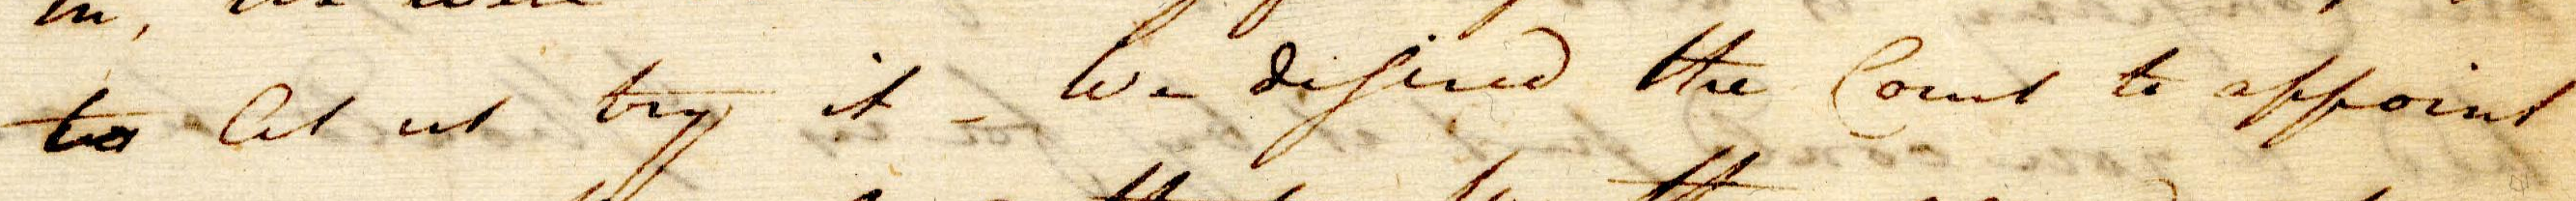to let us try it. We desired the Court to appoint
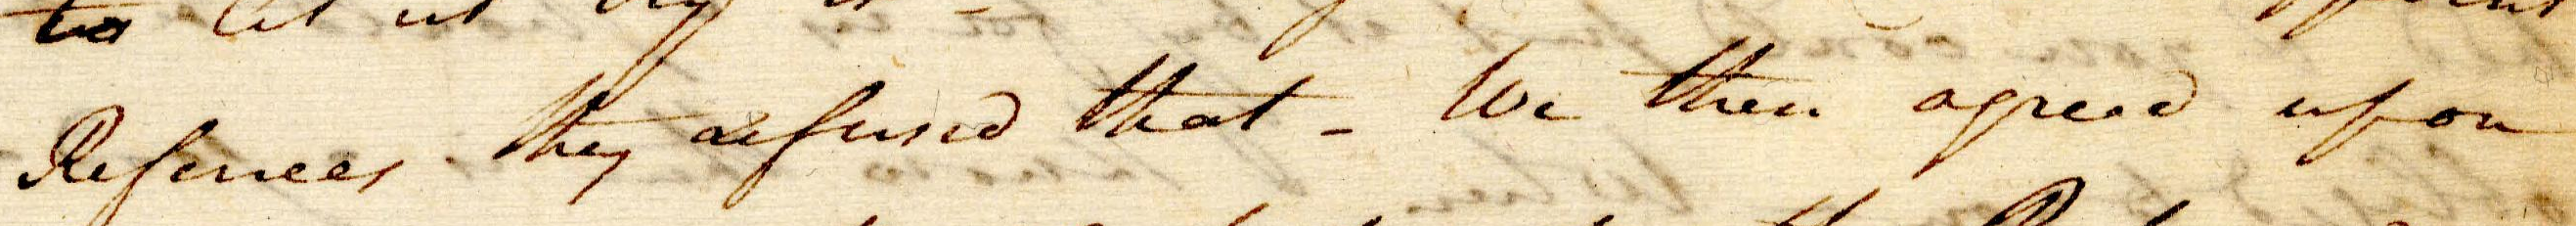References they refused that. We then agreed upon
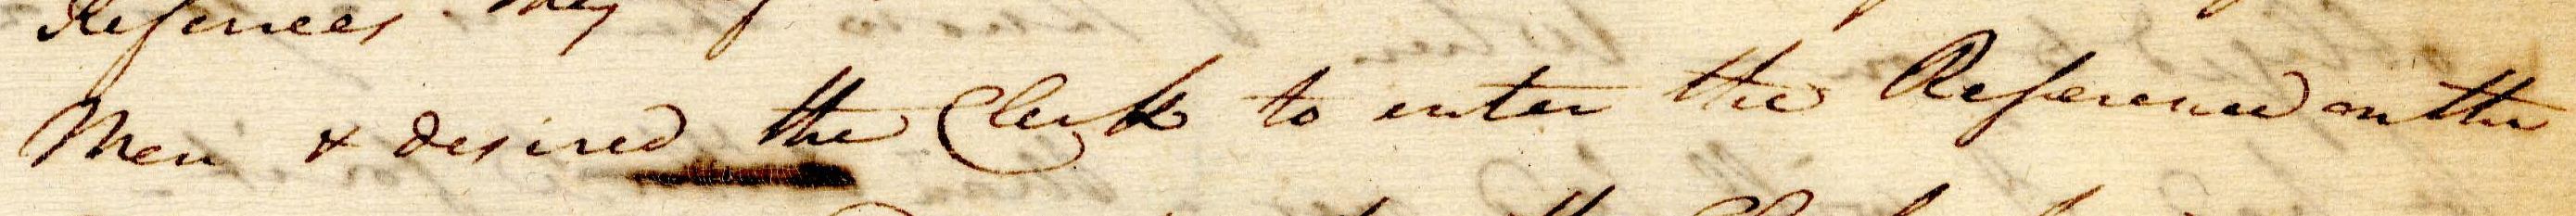Men & desired the Clerk to enter the Reference on the
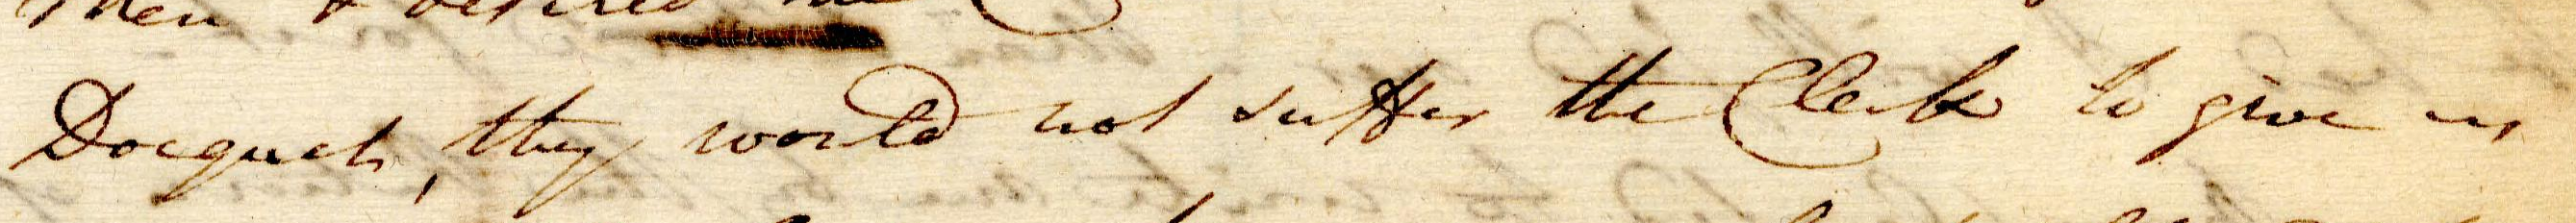Docquet they would not suffer the Clerk to give us
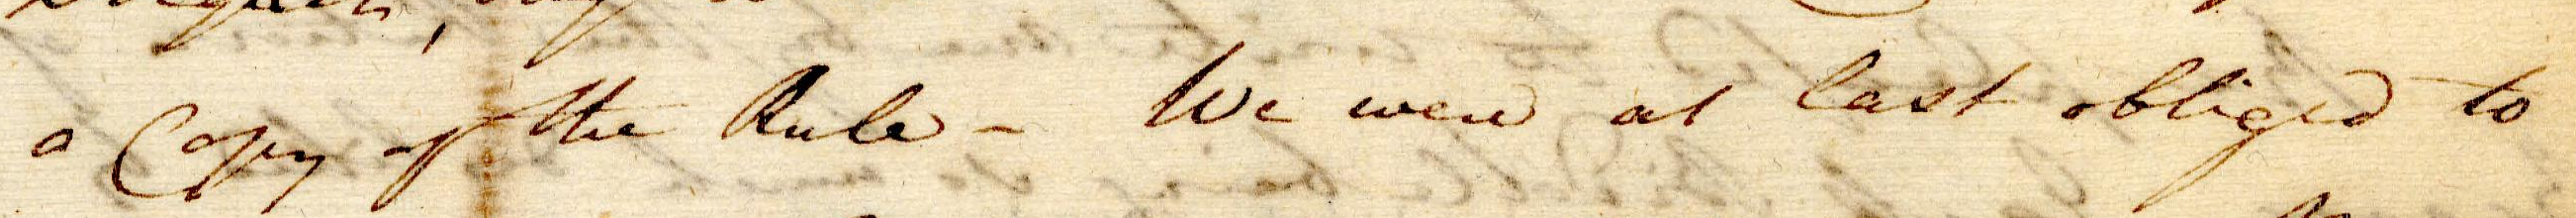a Copy of the Rule. We were at last obliged to
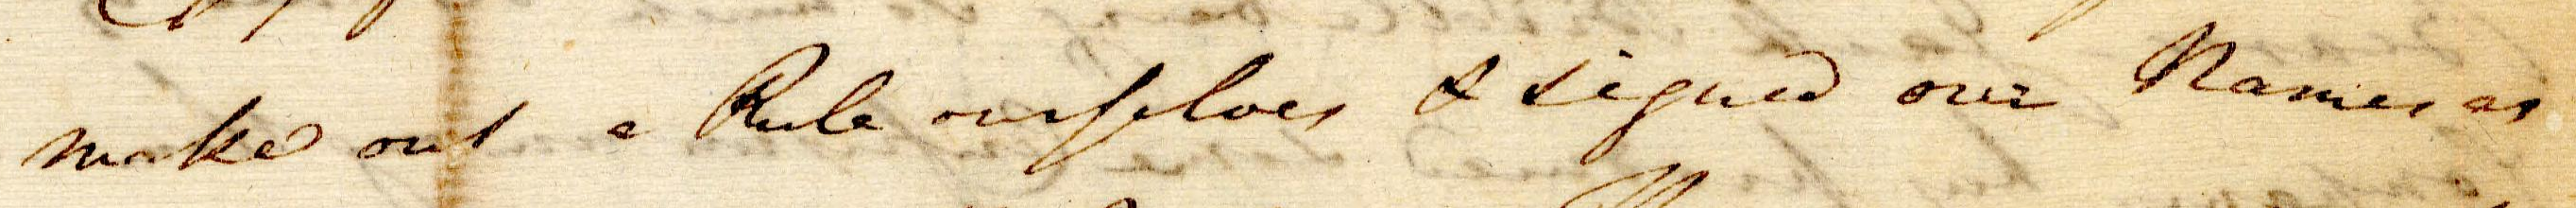make out a Rule ourselves & signed our Names as
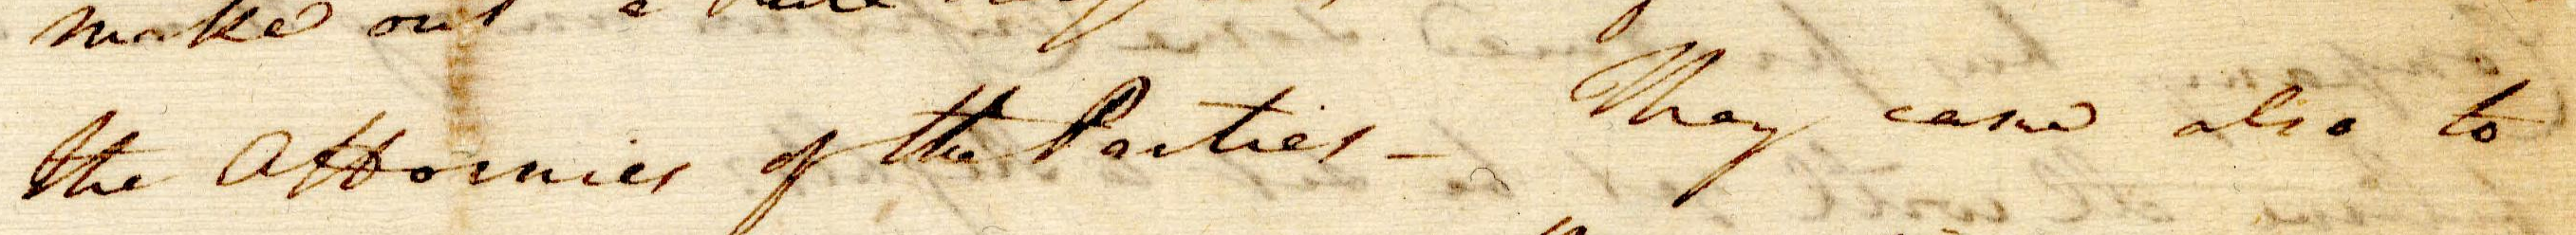the Attornies of the Parties. They came also to
